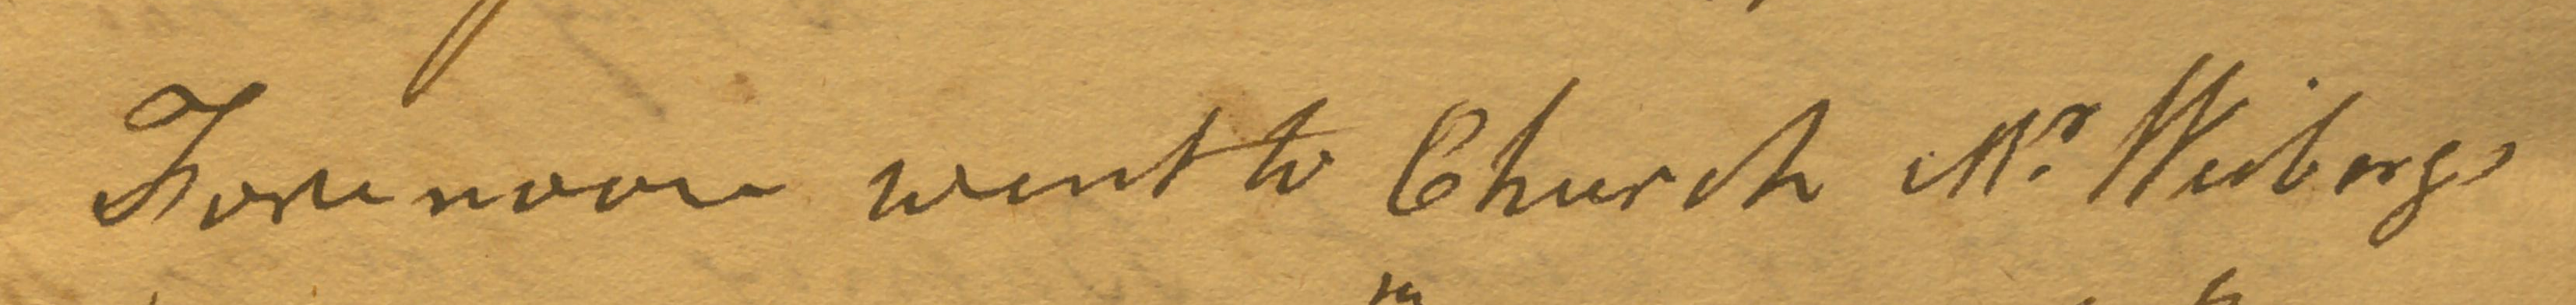Forenoon went to Church M^r. Weiberg
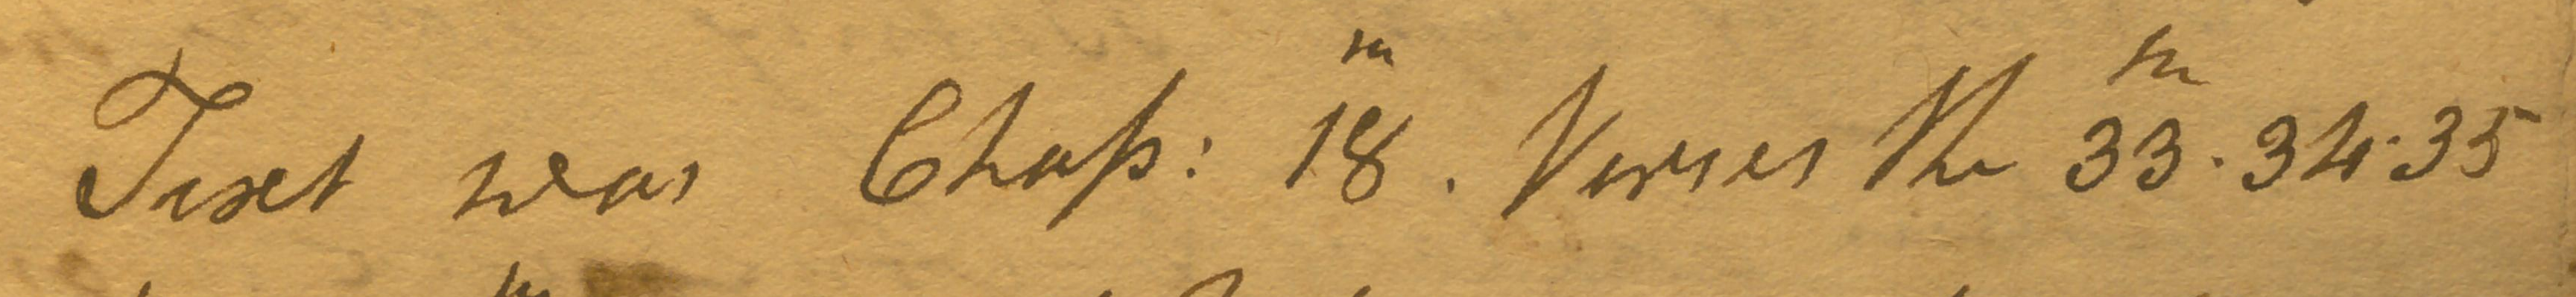Text was Chap: 18^th. Verses the 33^th. 34 35
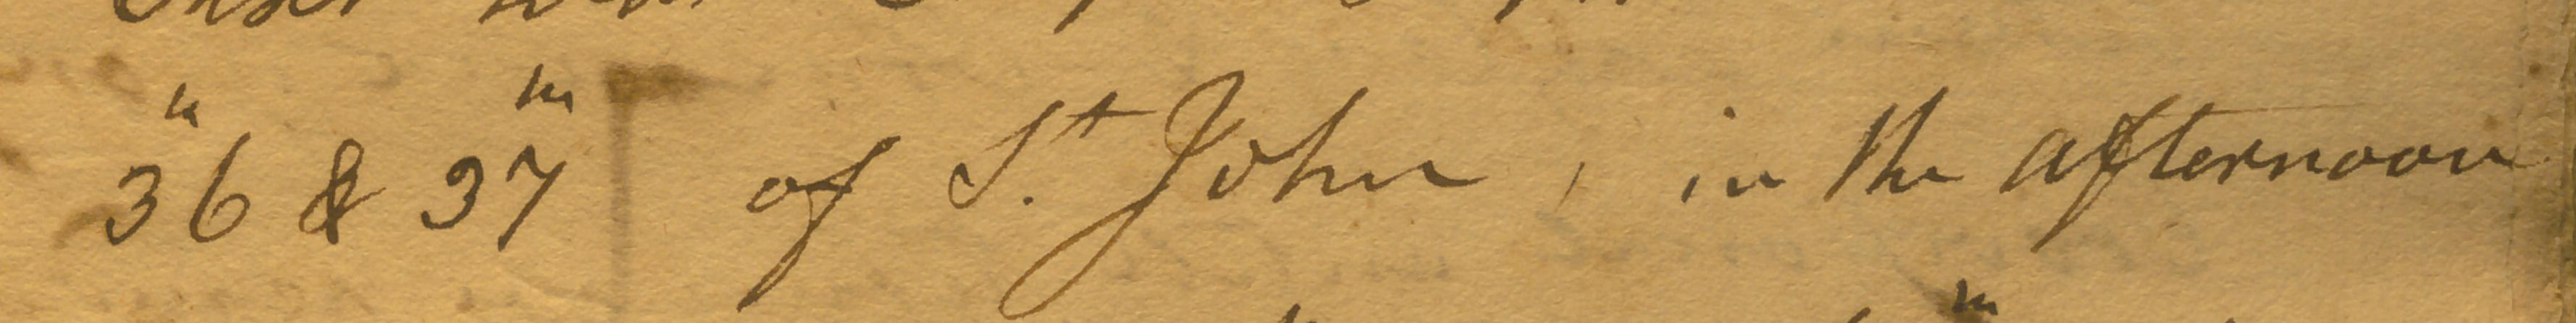36^th & 37^th of S^t. John, n the afternoon
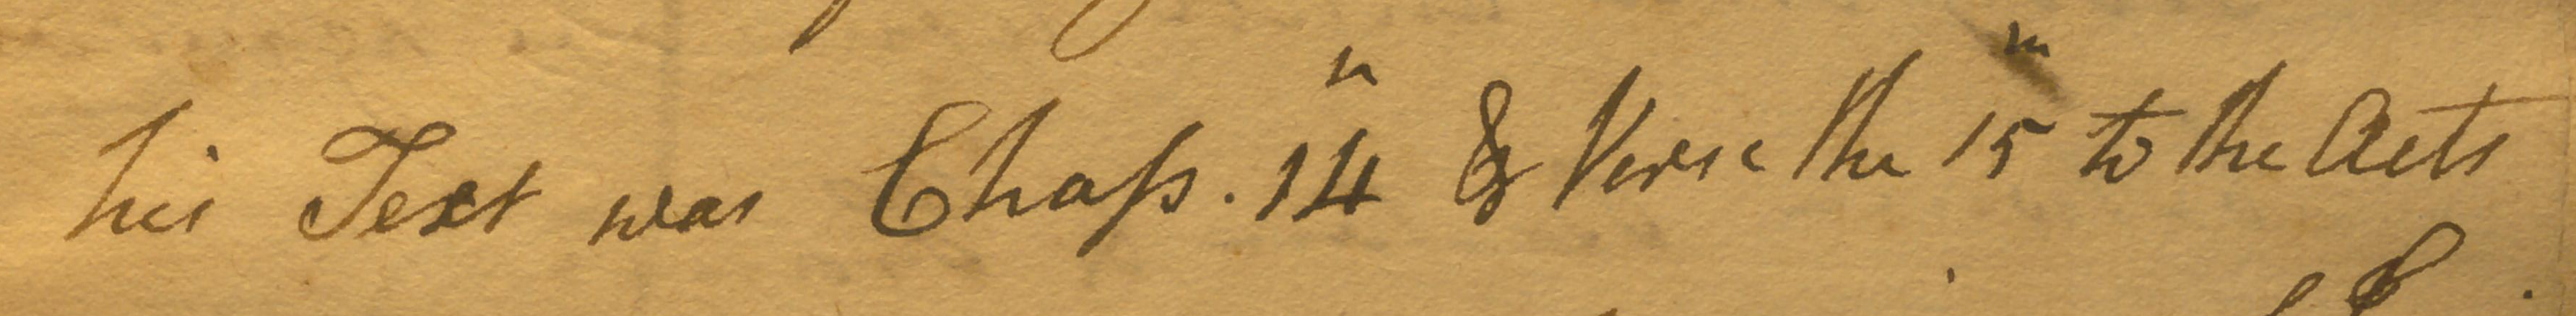his Text was Chap. 14^th & Verse the 15^th to the Acts
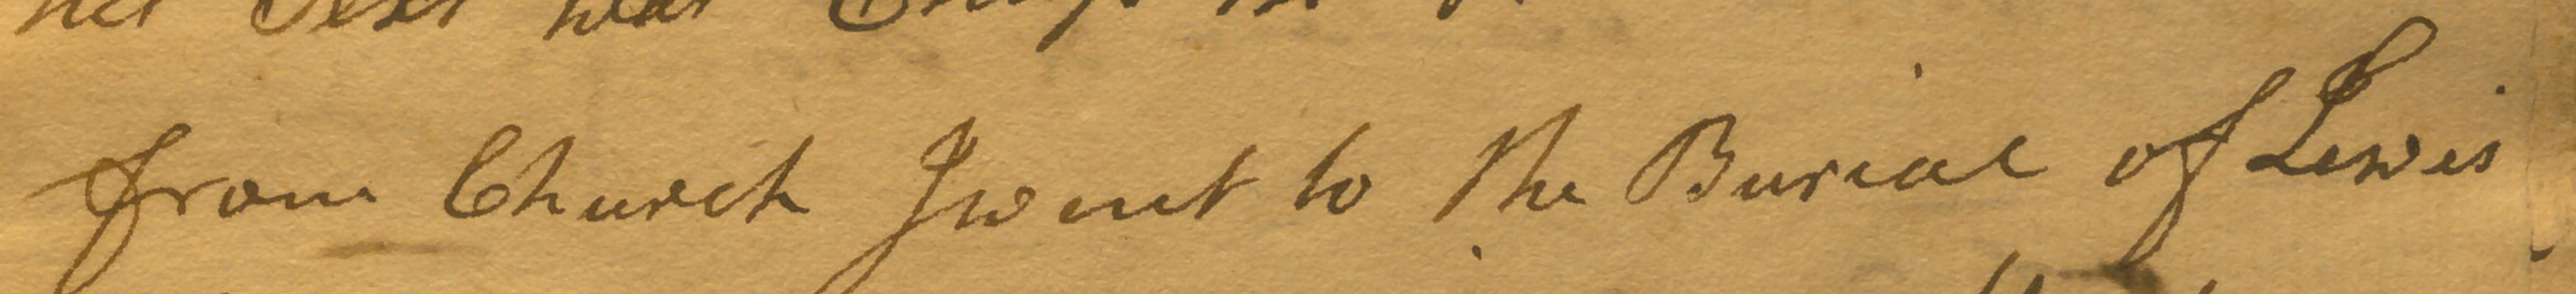from Church I went to the Burial of Lewes
